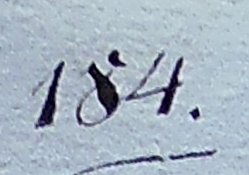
184.
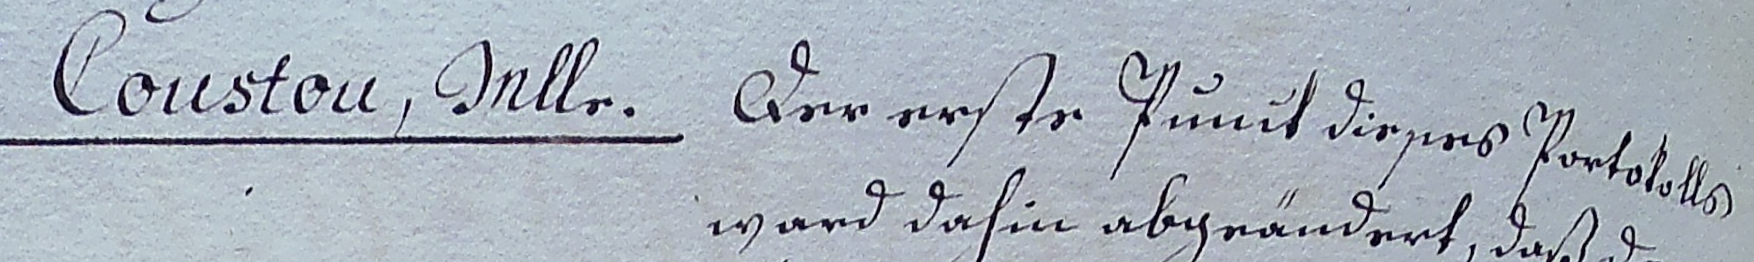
Coustou, Mlle. Der erste Punct dieses Portokolls
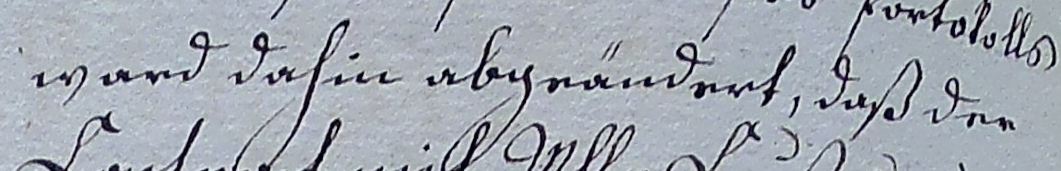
ward dahin abgeändert, daß der
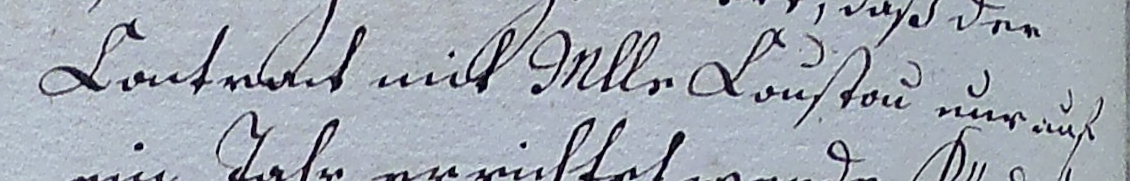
Contract mit Mlle Coustou nur auf
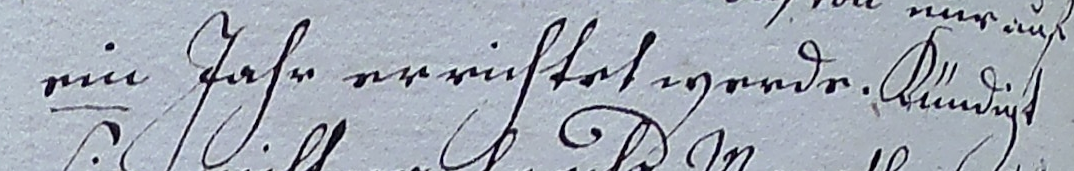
ein Jahr errichtet werde. Kündigt
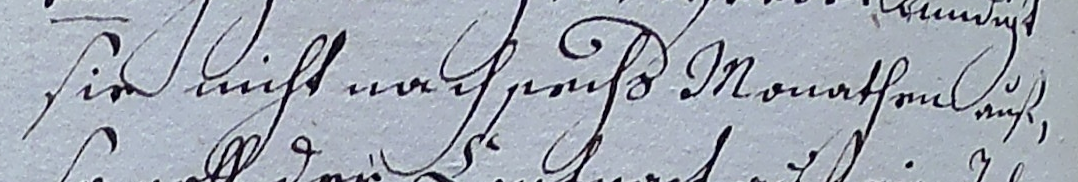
sie nicht nach sechs Monathen auf,
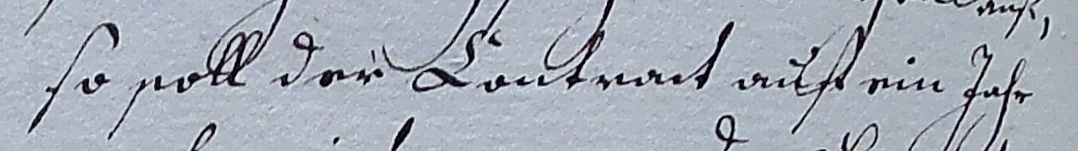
so soll der Contract auf ein Jahr
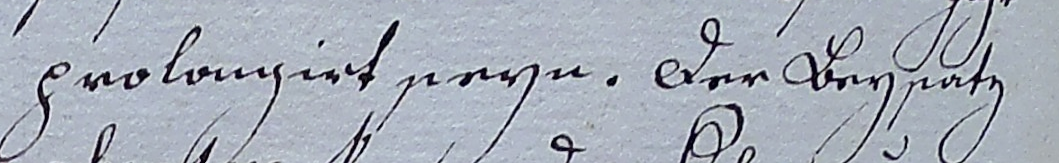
prolongirt seyn. Der Beysatz
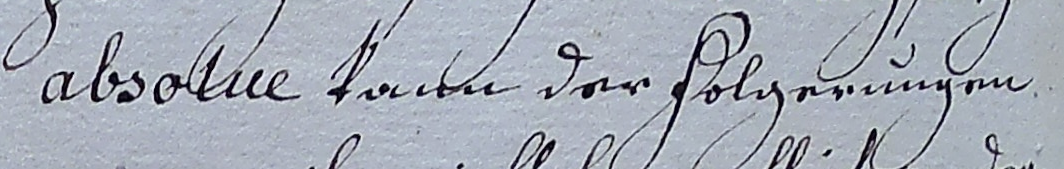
absolue kann der Folgerungen
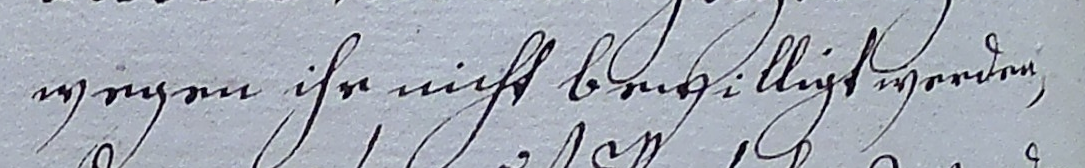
wegen ihr nicht bewilligt werden,
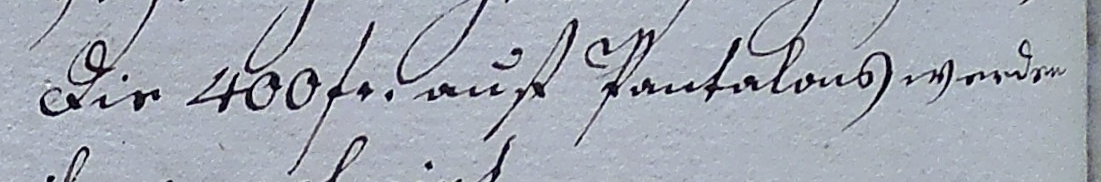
Die 400fr. auf Pantalons werden
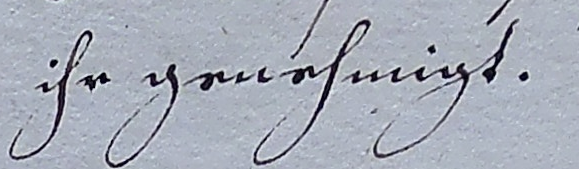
ihr genehmigt.
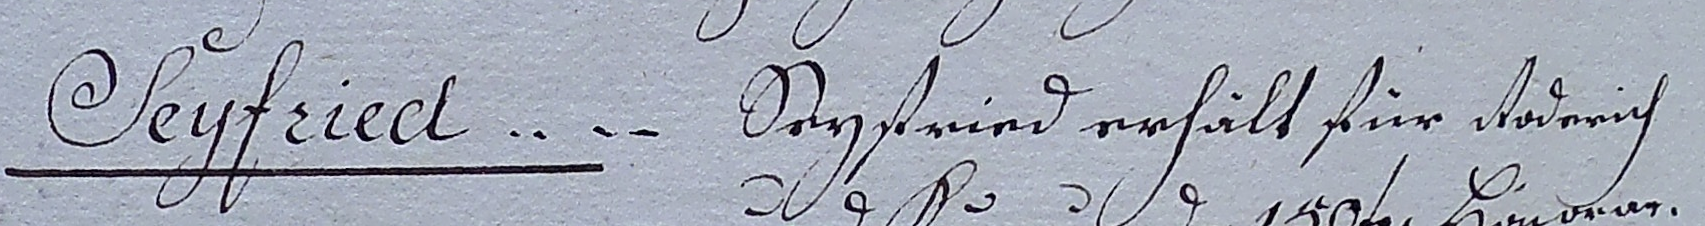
Seyfried .. .. .. Seyfried erhält für Roderich
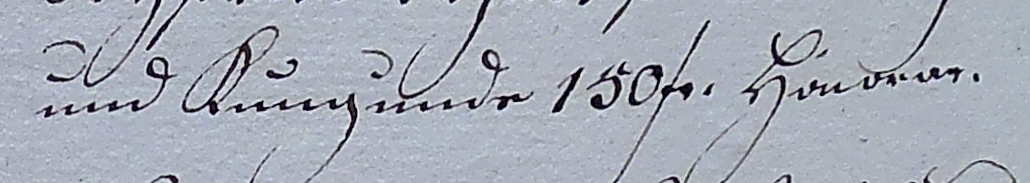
und Kungunde 150fr. Honorar.
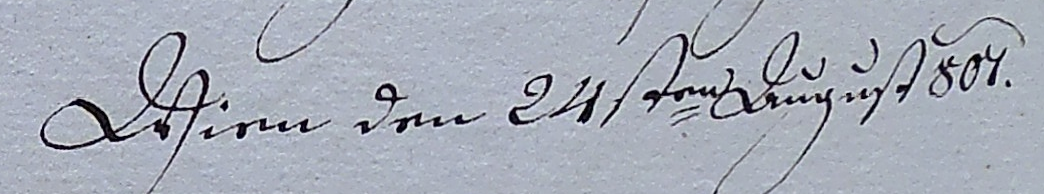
Wien den 24ste͇n August 8͞0͞7.
